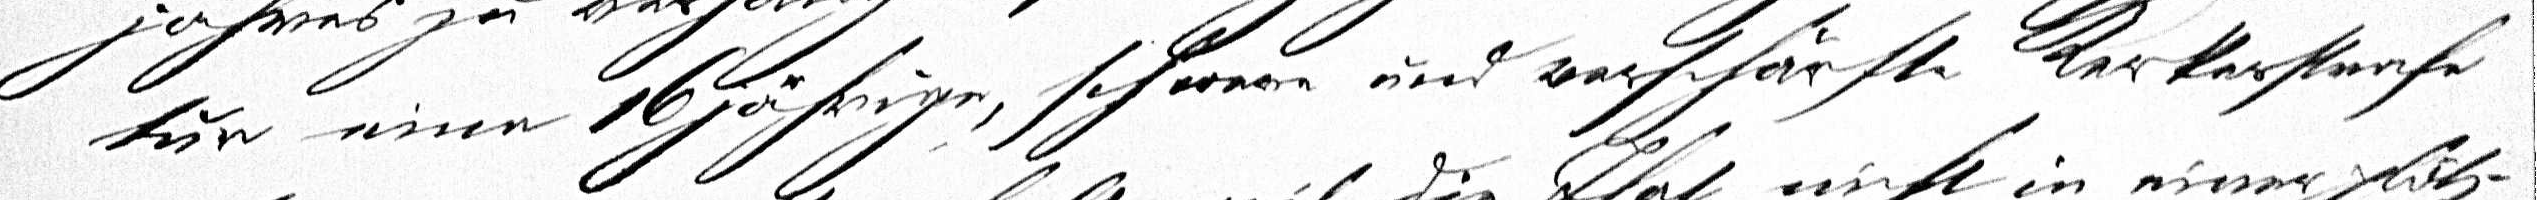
tur eine 16jährige, schwere und verschärfte Kerkerstrafe
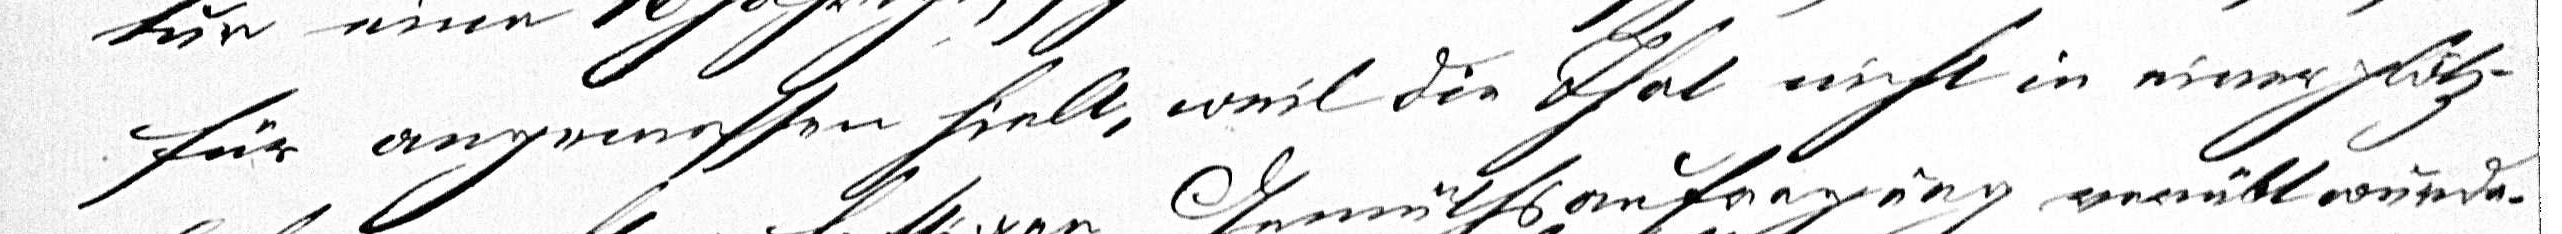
für angemessen hielt, weil die That nicht in einer plötz¬
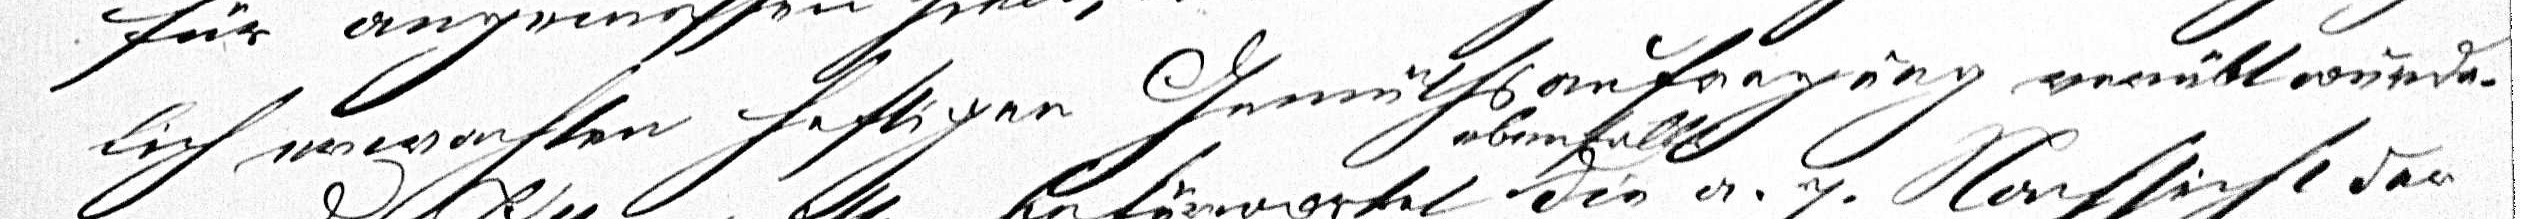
lich erwachten heftigen Gemüthsaufregung verübt wurde.
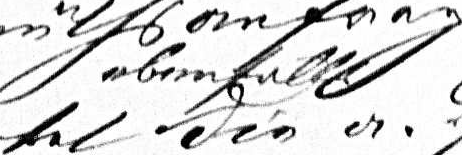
ebenfalls
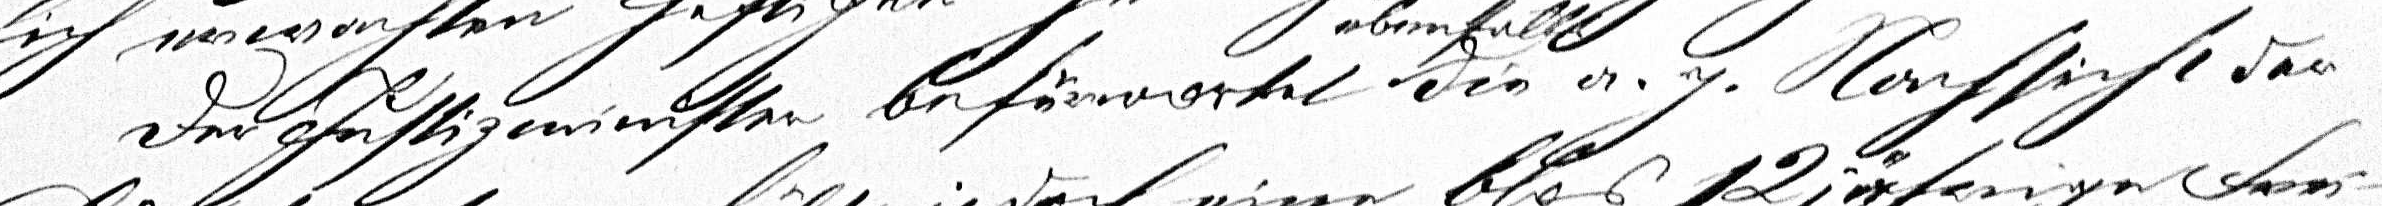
Der Justizminister befürwortet die a. g. Nachsicht der
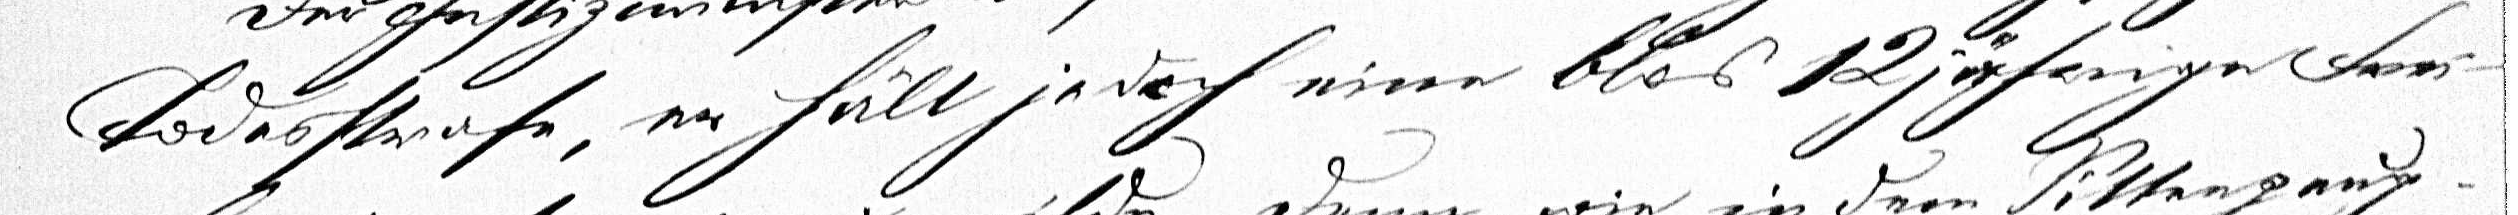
Todesstrafe, er hält jedoch eine blos 12jährige Frei¬
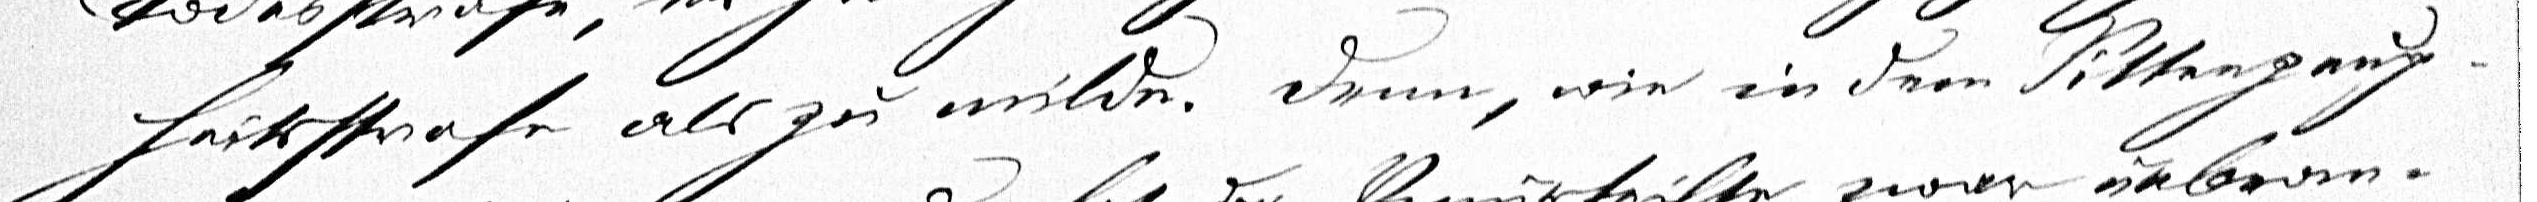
heitsstrafe als zu wilde. Denn, wie in dem Sittenzeug¬
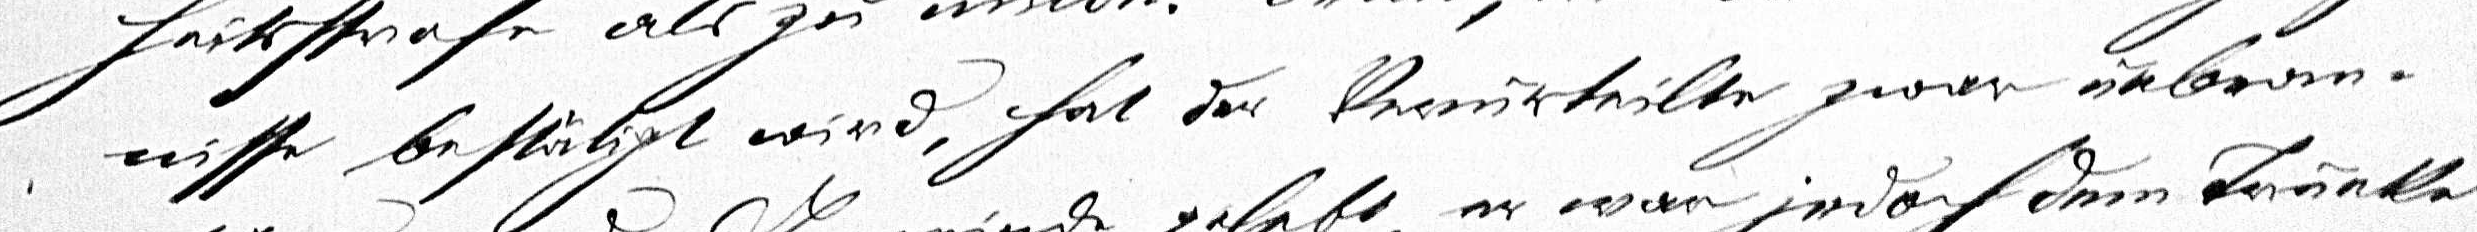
nisse bestätigt wird, hat der Verurteilte zwar unbean¬
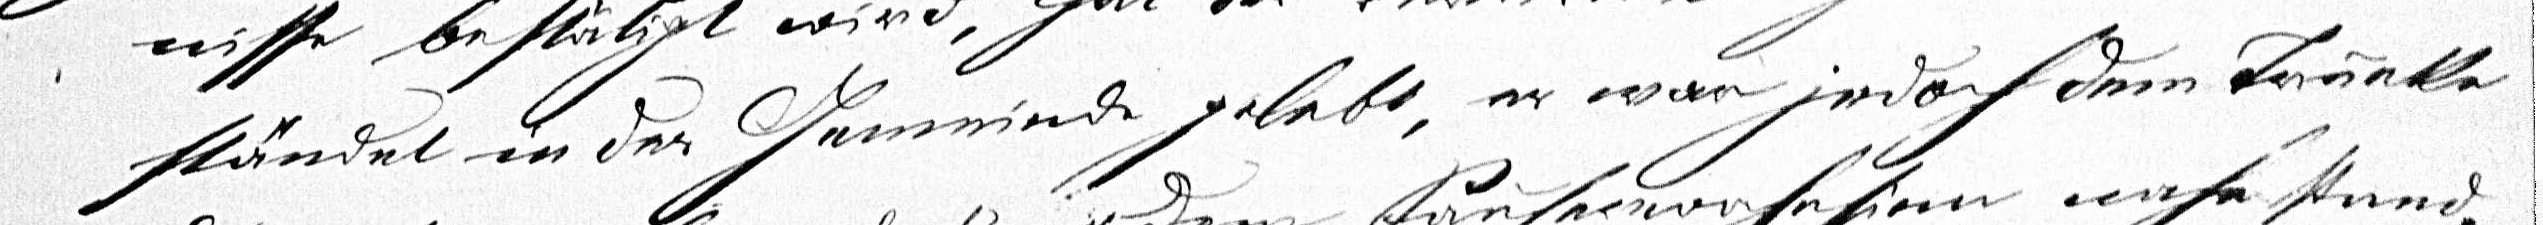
ständet in der Gemeinde gelebt, er war jedoch dem Trunke
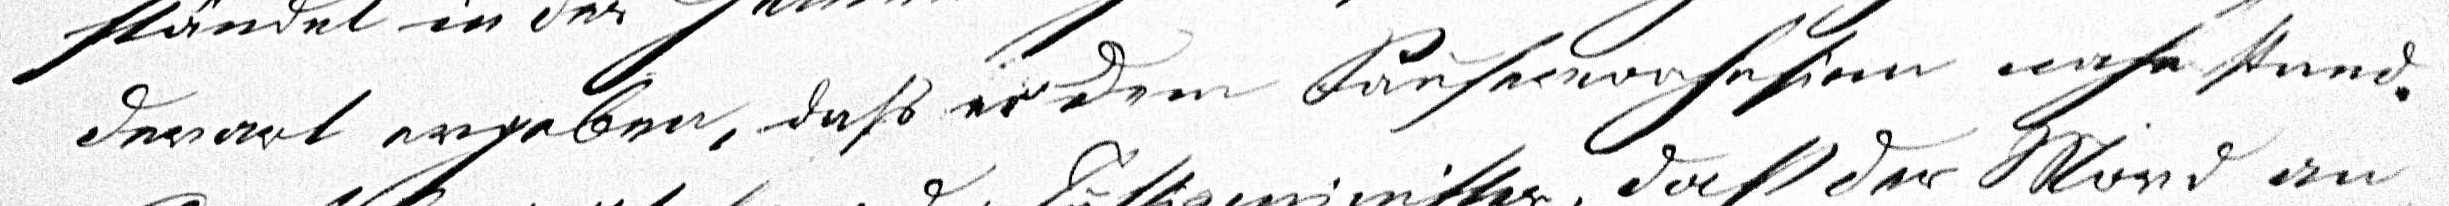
derart ergeben, daß er dem Sausexx nahe stand.
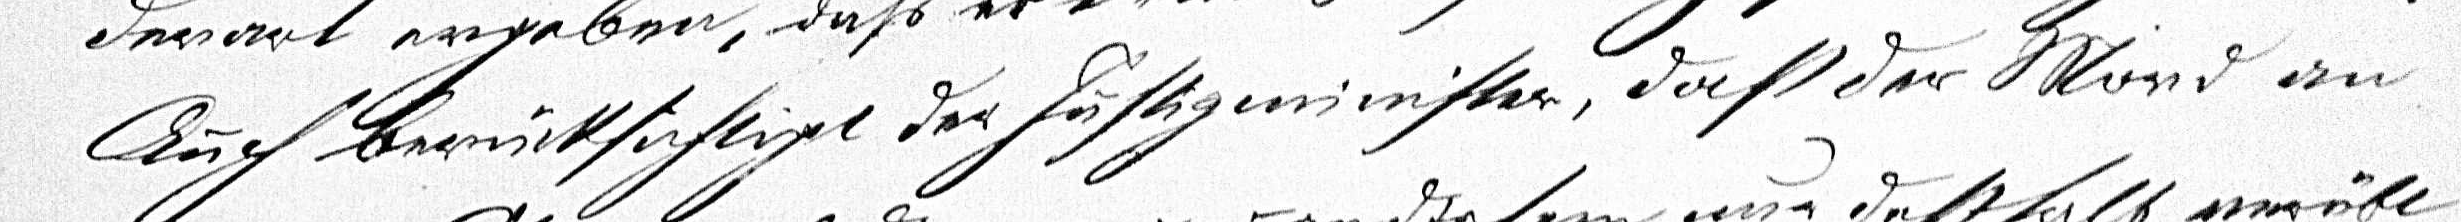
Auch berücksichtigt der Justizminister, daß der Mord an
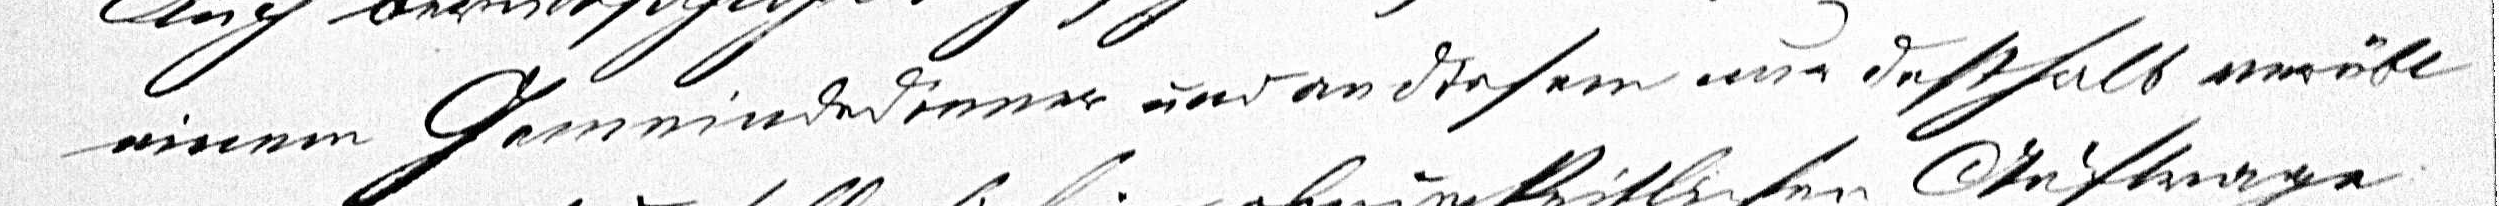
einem Gemeindedinner und an diesem und deßhalb verübt
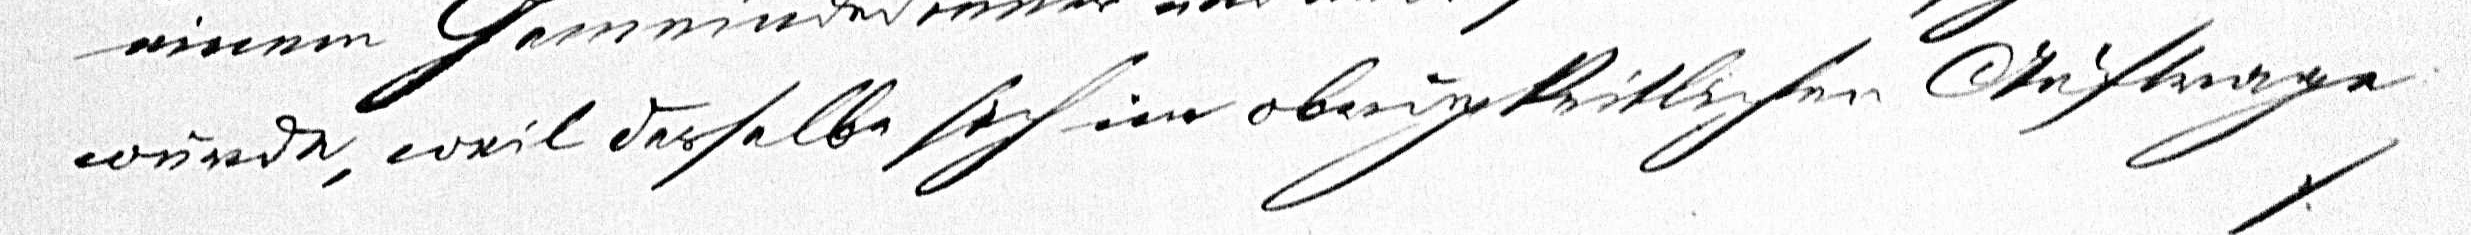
wurde, weil derselbe sich im obrigkeitlichen Auftrage
